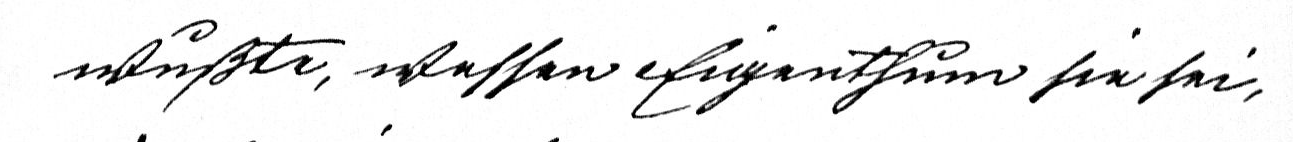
wußte, wessen Eigenthum sie sei,
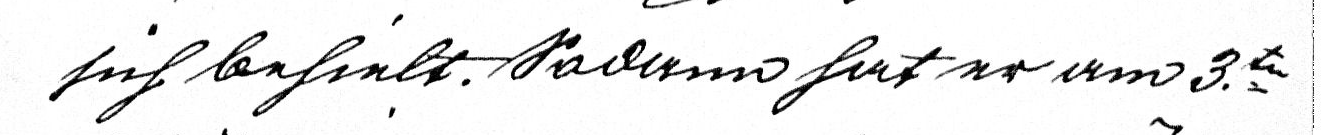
sich behielt. Sodann hat er am 3. ten
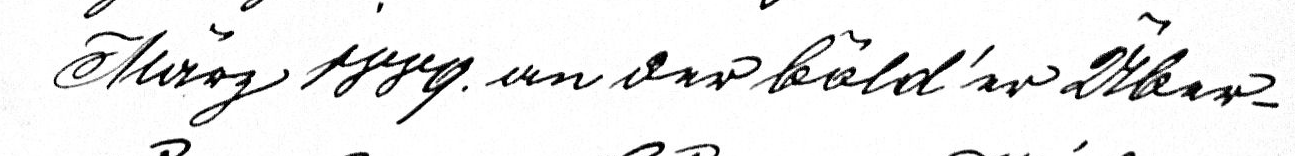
März 1889. an der böld'er Über¬
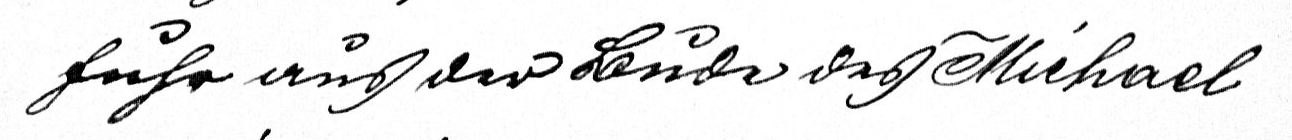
fuhr aus der Bude des Michael
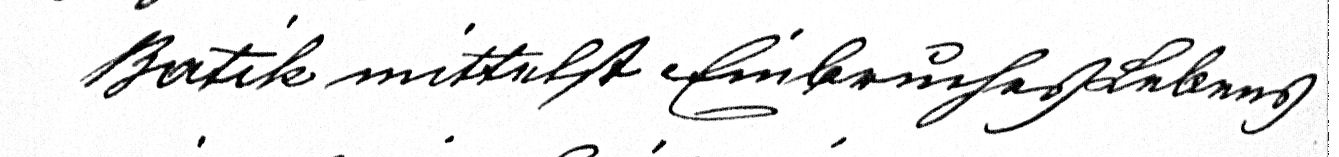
Batik mittelst Einbruches Lebens
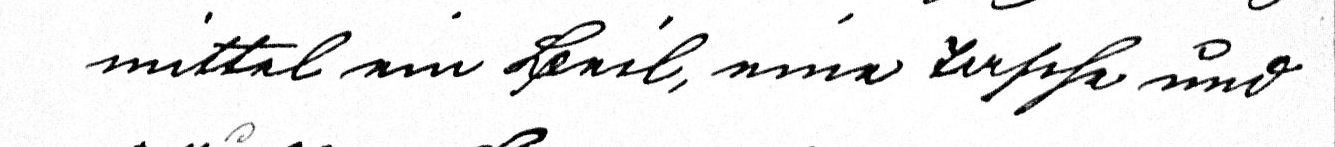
mittel ein Beil, eine Tasche und
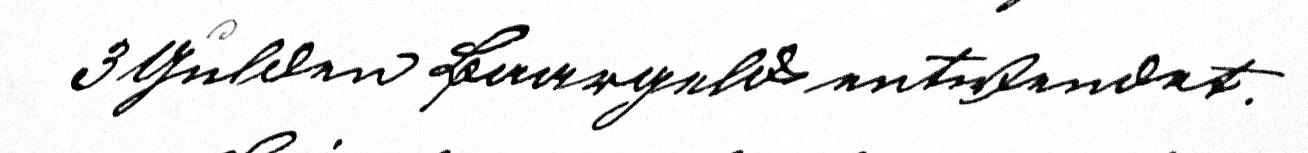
3 Gulden Baargeld entwendet.
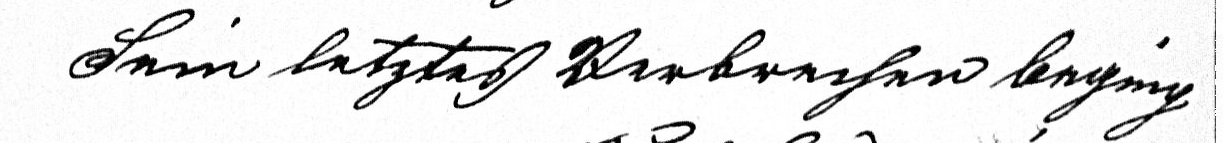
Sein letztes Verbrechen beging
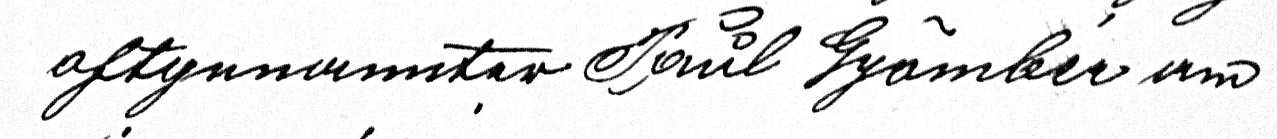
oftgenannter Paul Gyömbér am
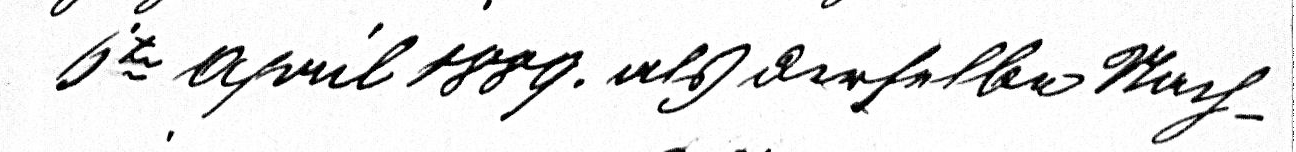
6ten April 1889. als derselbe Nach¬
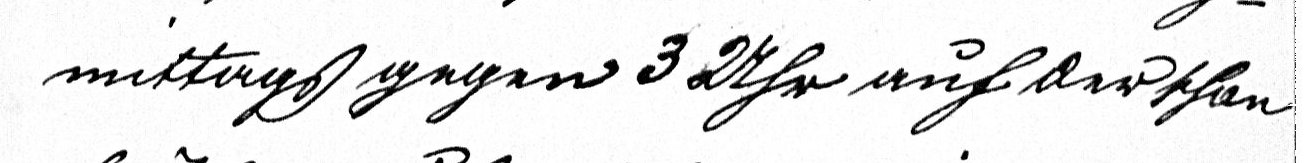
mittags gegen 3 Uhr auf der schon
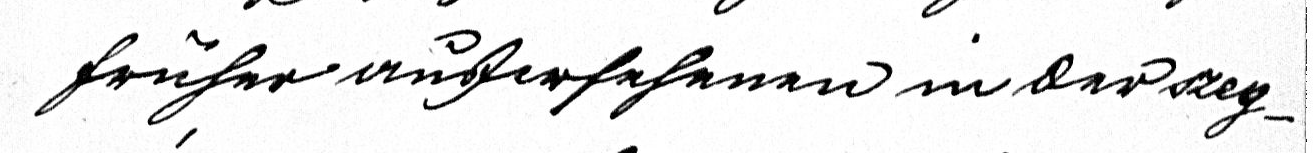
früher ausersehenen in der szeg¬
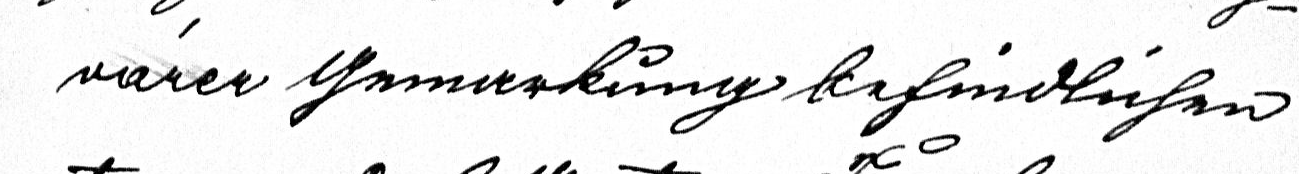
várer Gemarkung befindlichen
